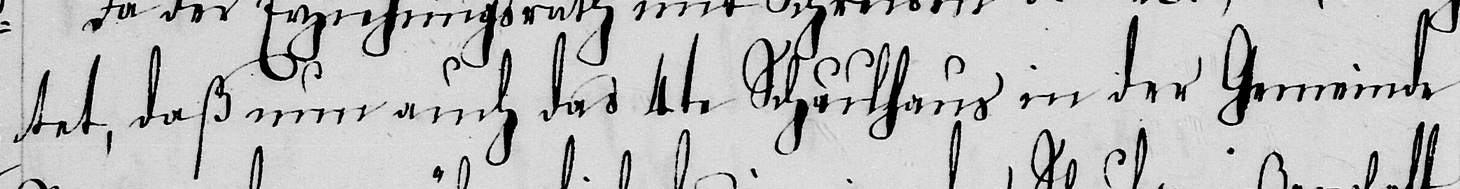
htet, daß nun auch das 4te Schulhaus in der Gemeinde
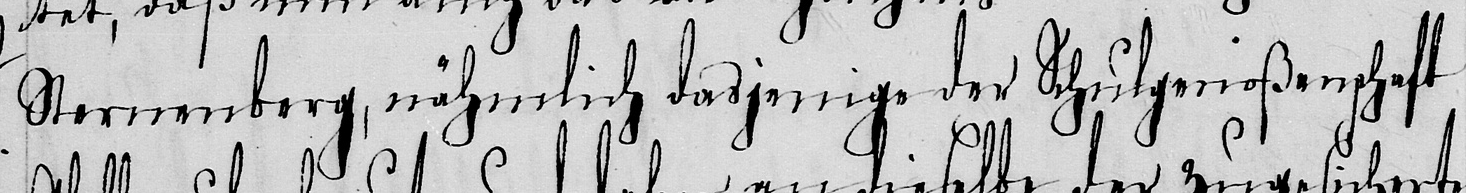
Sternenberg, nähmlich dasjenige der Schulgenoßenschaft
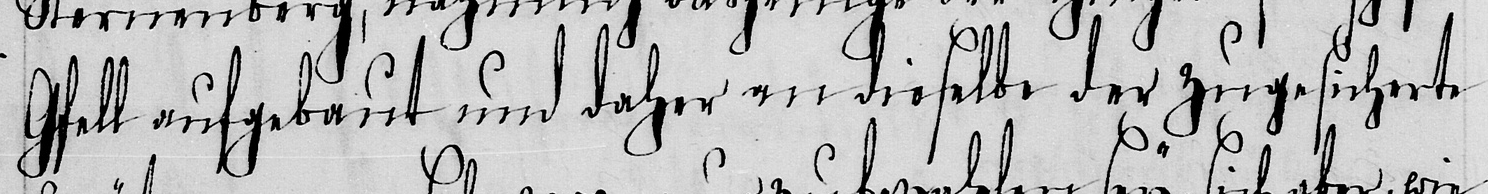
Gfell aufgebaut und daher an dieselbe der zugesicherte
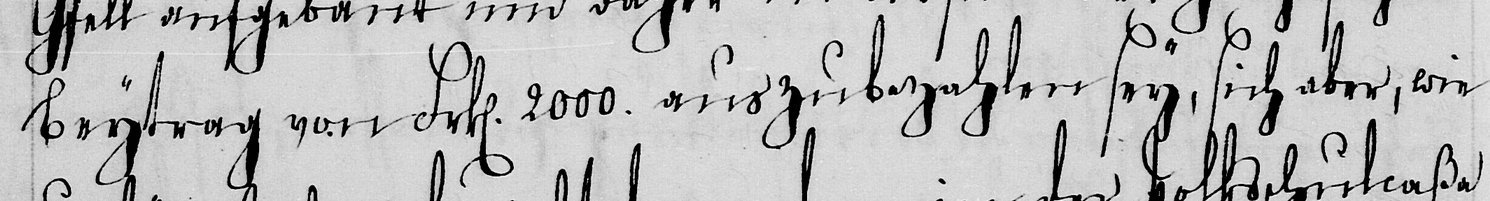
Beytrag von Frk[en]. 2000. auszubezahlen sey, sich aber, wie
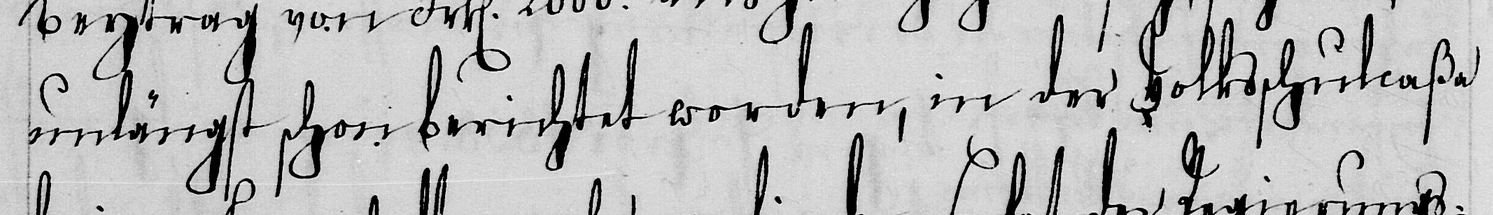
unlängst schon berichtet worden, in der Volksschulcaßa
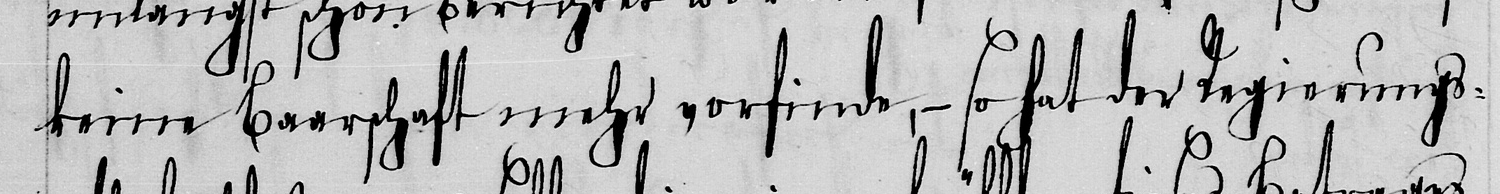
keine Baarschaft mehr vorfinde, – so hat der Regierungs¬
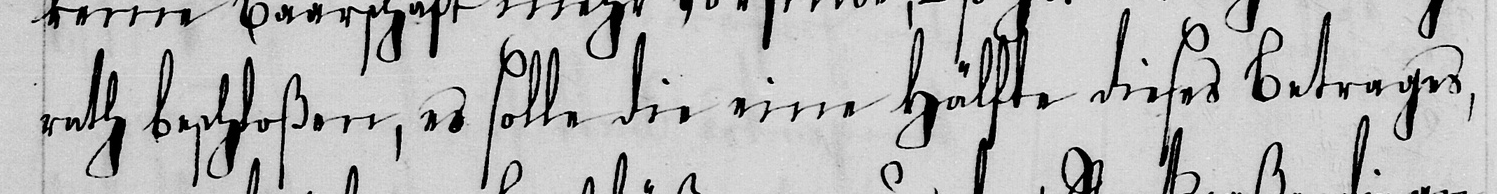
rath beschloßen, es solle die eine Hälfte dieses Betrages,
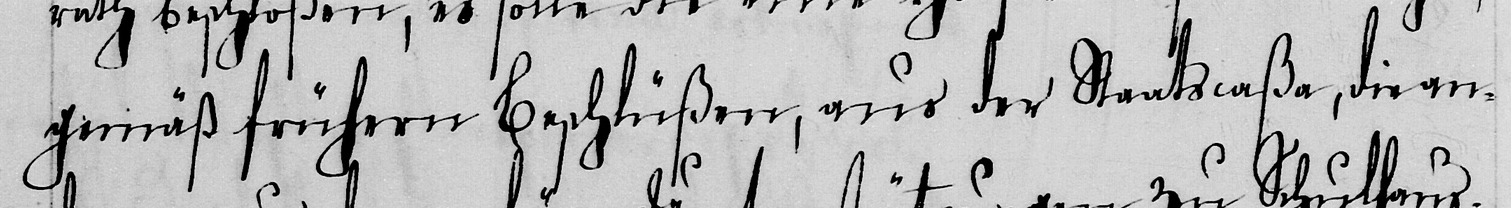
gemäß frühern Beschlüßen, aus der Staatscaßa, die an¬
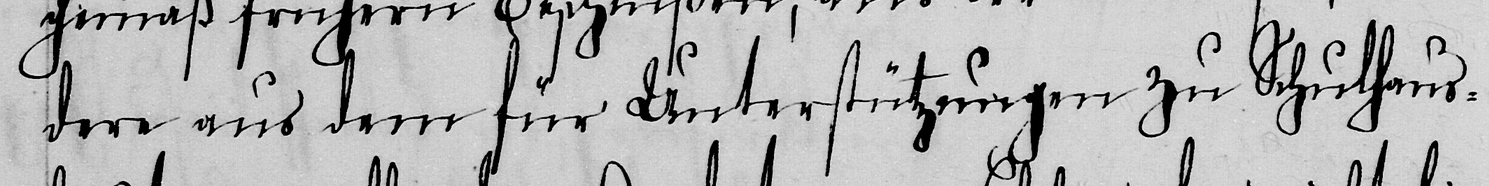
dere aus dem für Unterstützungen zu Schulhaus¬
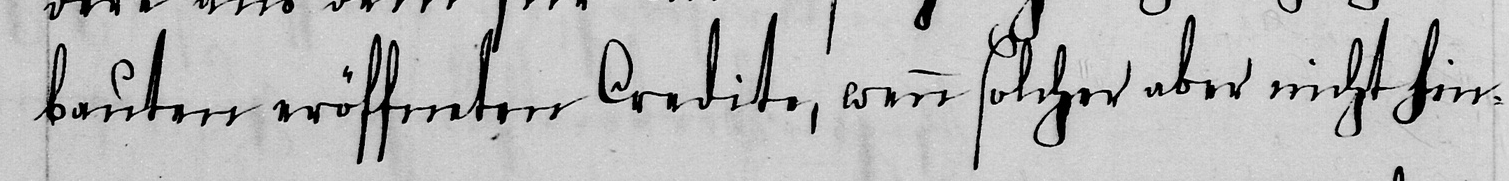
bauten eröffneten Credite, wenn solcher aber nicht hin-
